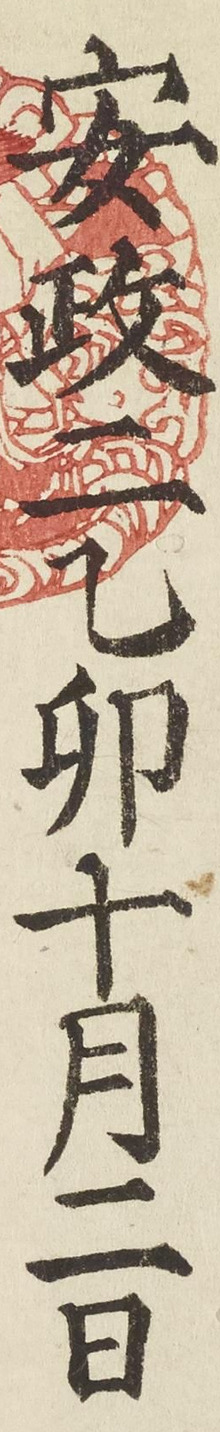安政二乙卯十月二日
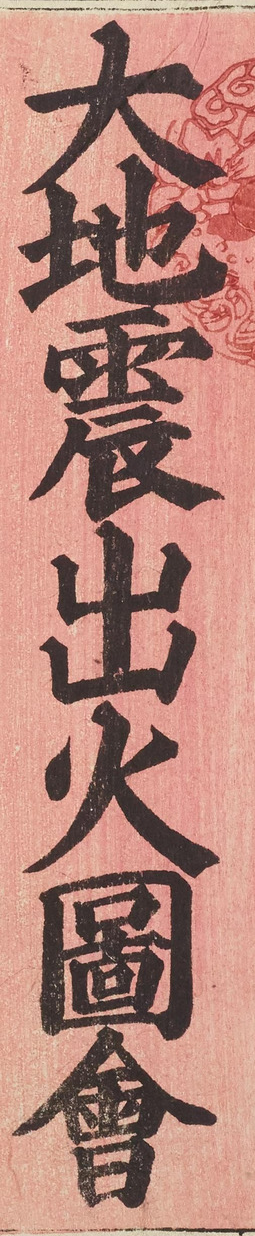大地震出火図会
